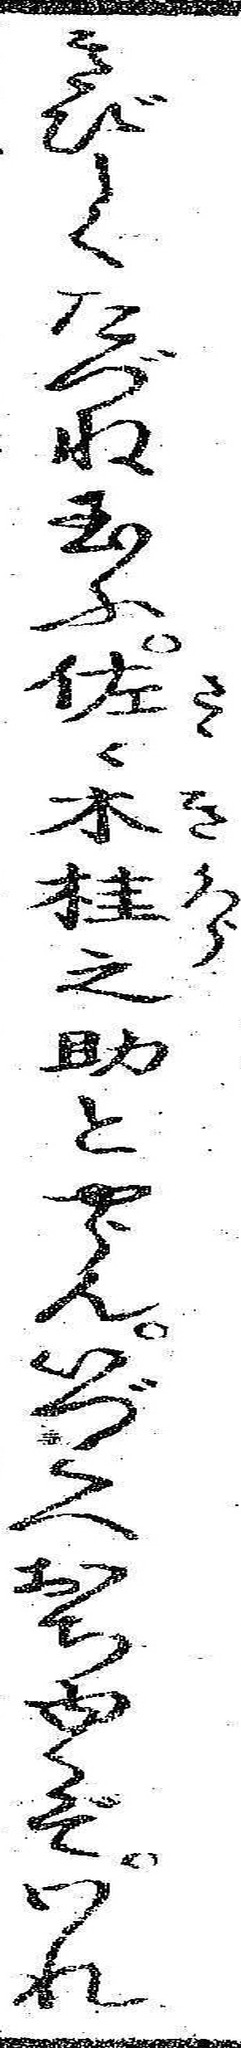きびしくたづね玉ふ。佐々木桂之助とやらん。いづくへおちゆくぞ。われ
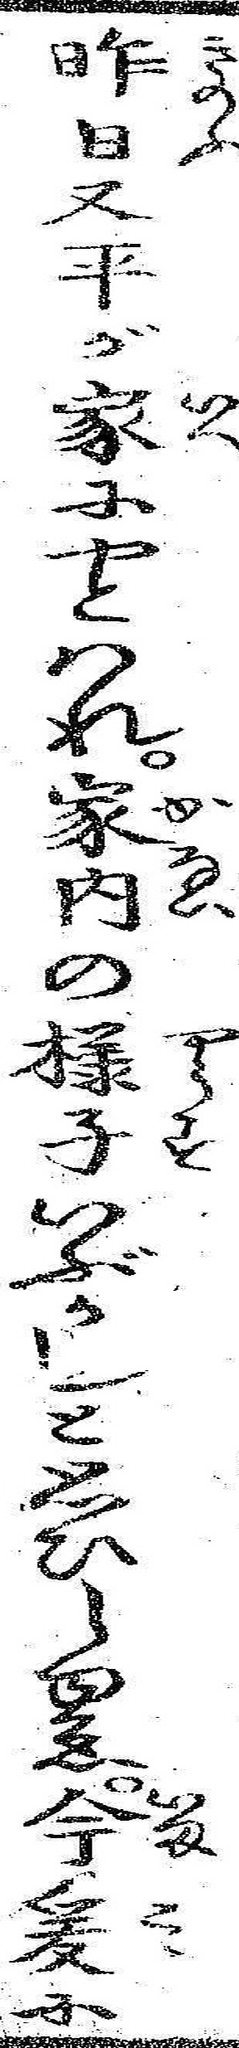昨日又平が家にやとはれ。家内の様子いぶかしと思ひしゆゑ。今爰に
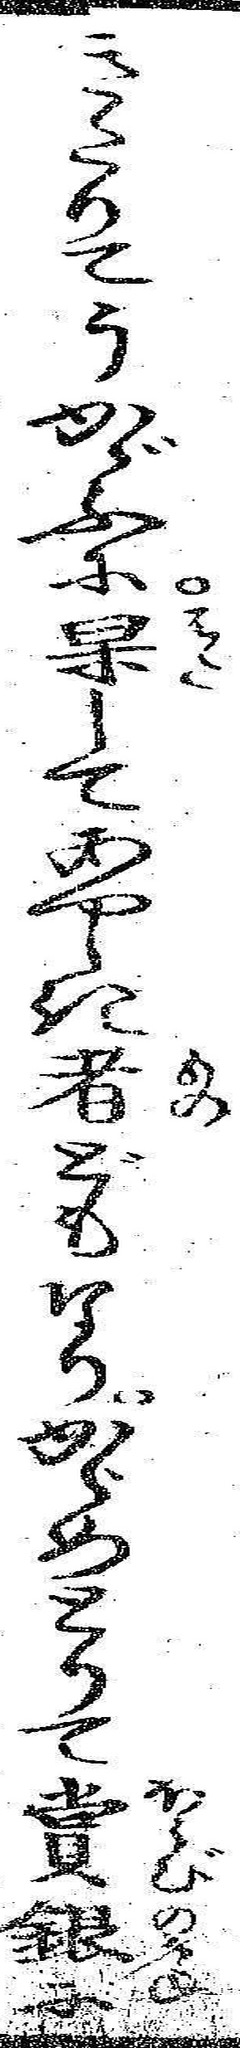きたりてうかゞふに。果してあやしき者どもなり。からめとりて賞銀に
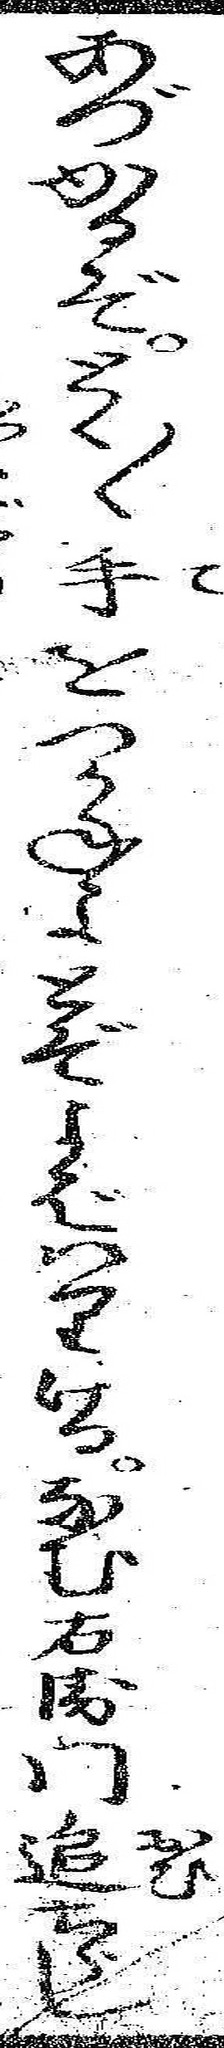あづかるぞ。とく〳〵手をつかねよとぞよばはりける。なむ右衛門追ちらし
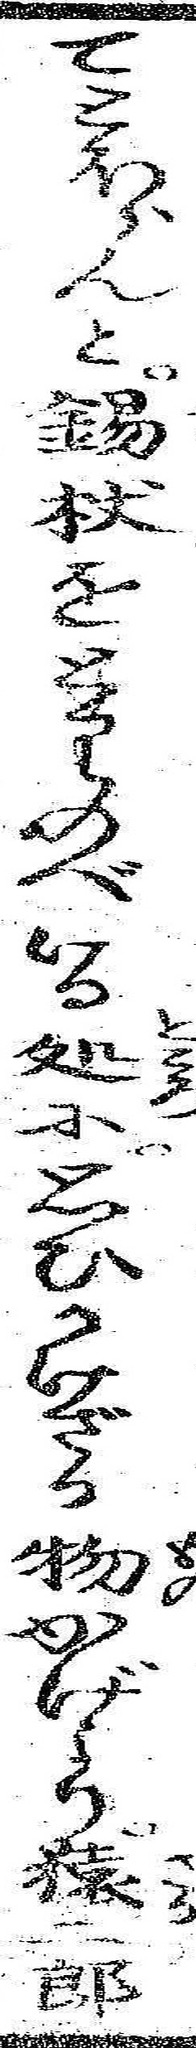てとほらんと。錫杖をとりのべける処に。思ひかけざる物かげより。猿二郎

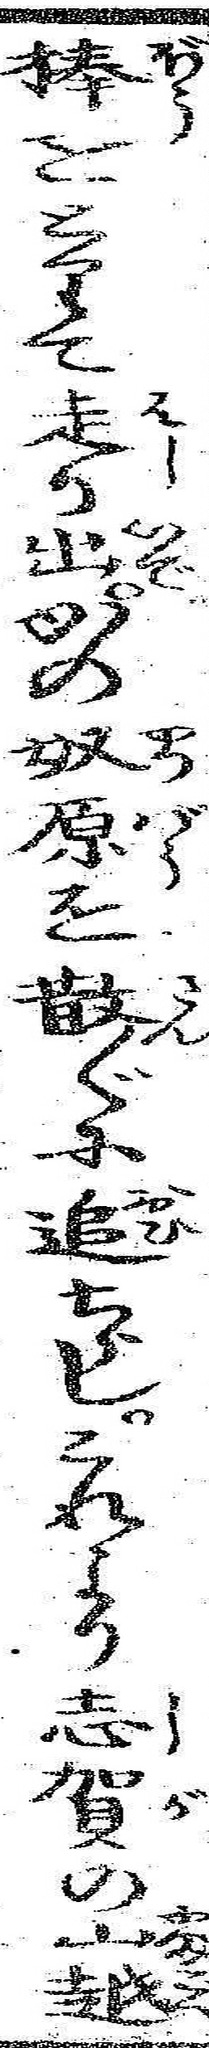棒をとりて走り出。かの奴原を散〴〵に追ちらし。これより志賀の山越
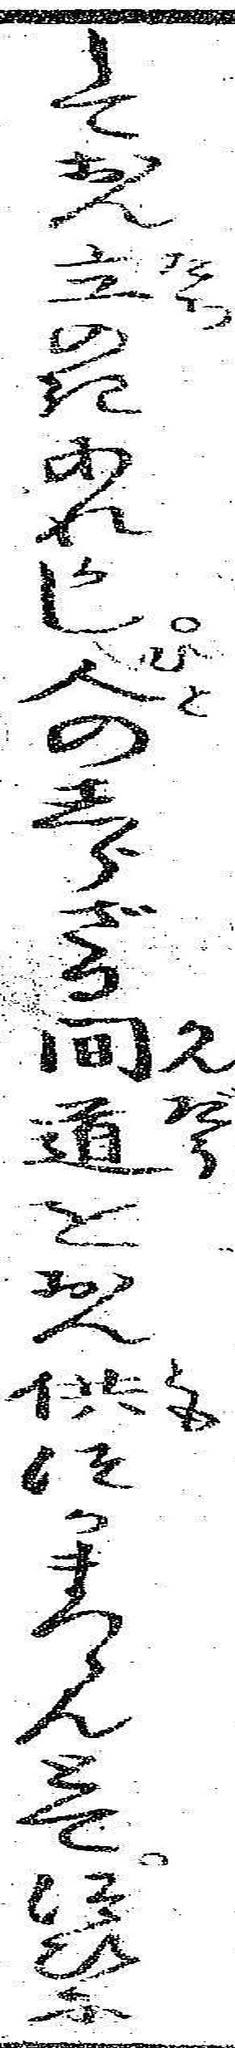しておん立のきあれかし。人のしらざる間道をおん供つかまつらんとて。つひに
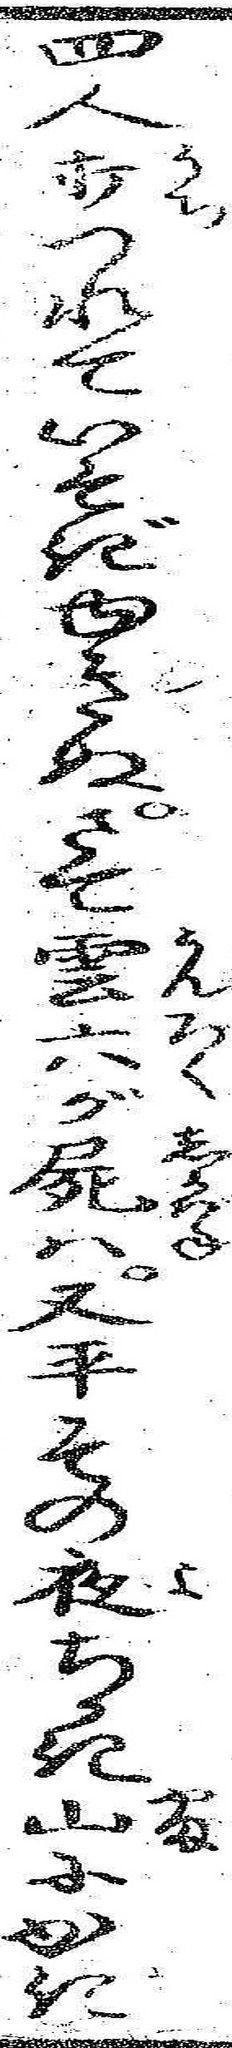四人打つれていそぎゆきぬ。さて雲六が屍は。又平その夜ちかき山にかき
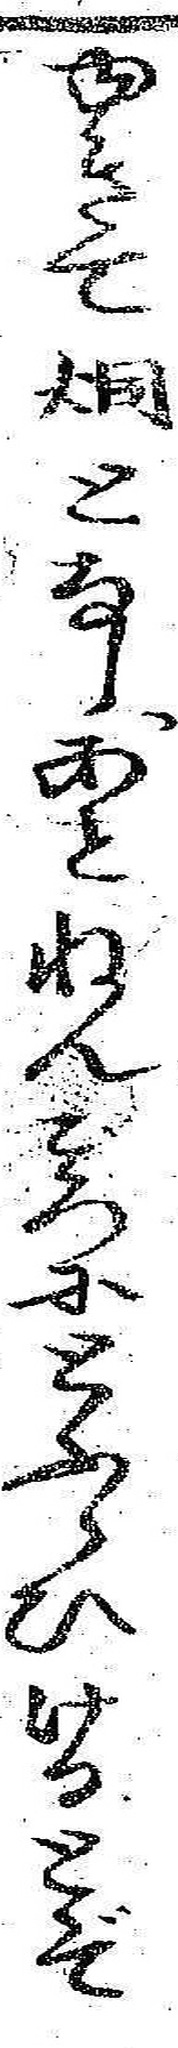ゆきて煙となし。あとねんごろにとふらひけるとぞ
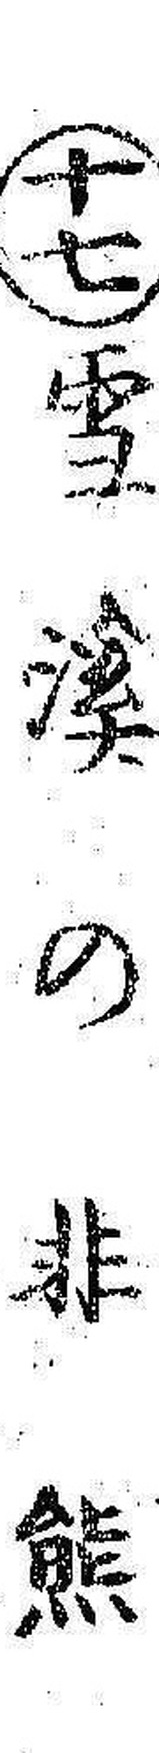十七雪渓の非熊
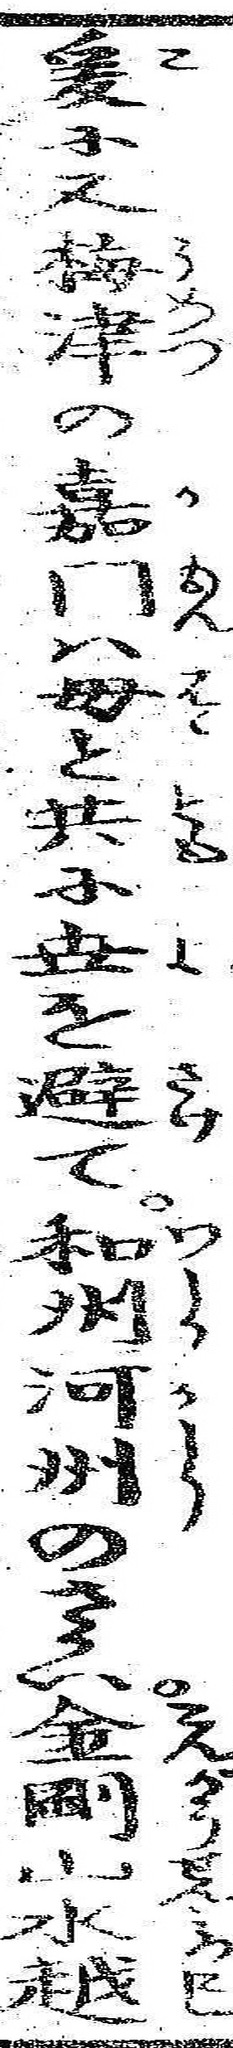爰に又梅津の嘉門は母と共に世を避て。和州河州のさかい。金剛山水越
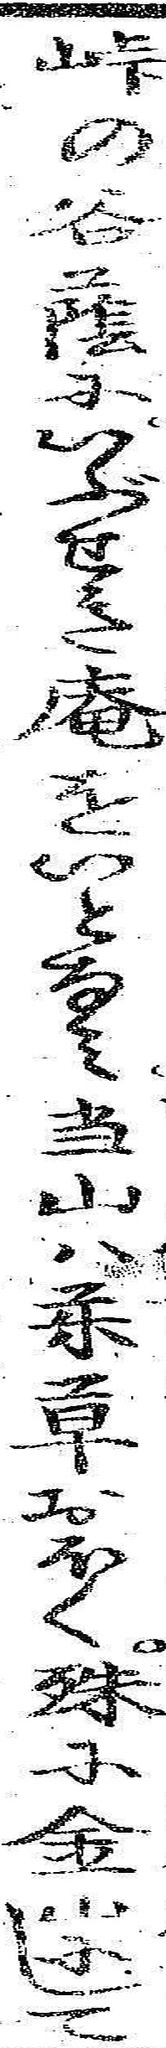峠の谷蔭に。いぶせき庵をいとなみ。当山は薬草おほく。殊に金山にして
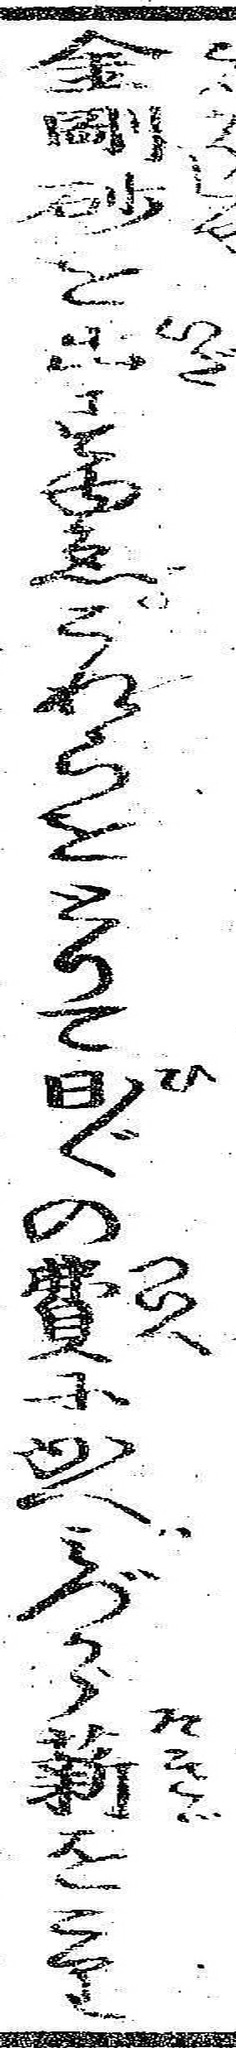金剛砂を出すゆゑ。これらをとりて日の費にかへ。みづから薪をとり
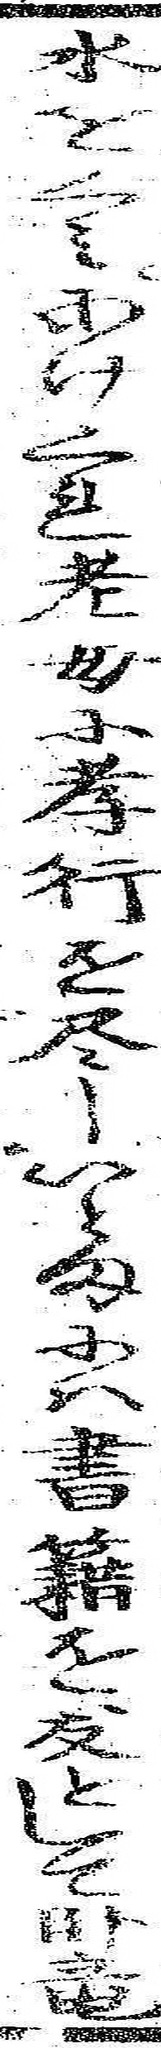水をくみ。あけくれ老母に孝行を尽し。いとまには書籍を友として臥竜
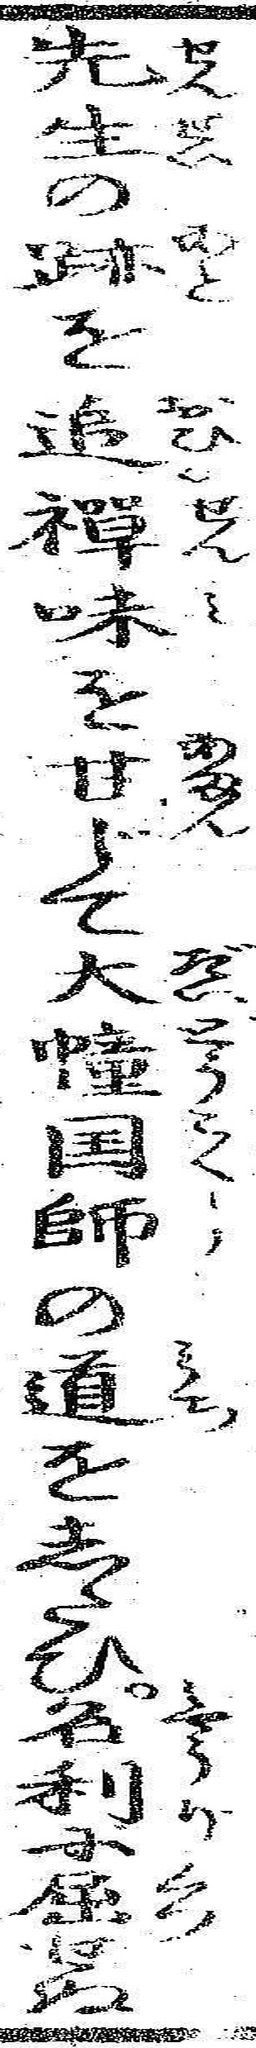先生の跡を追。禅味を甘じて大幢国師の道をしたひ。名利に屈せぬ
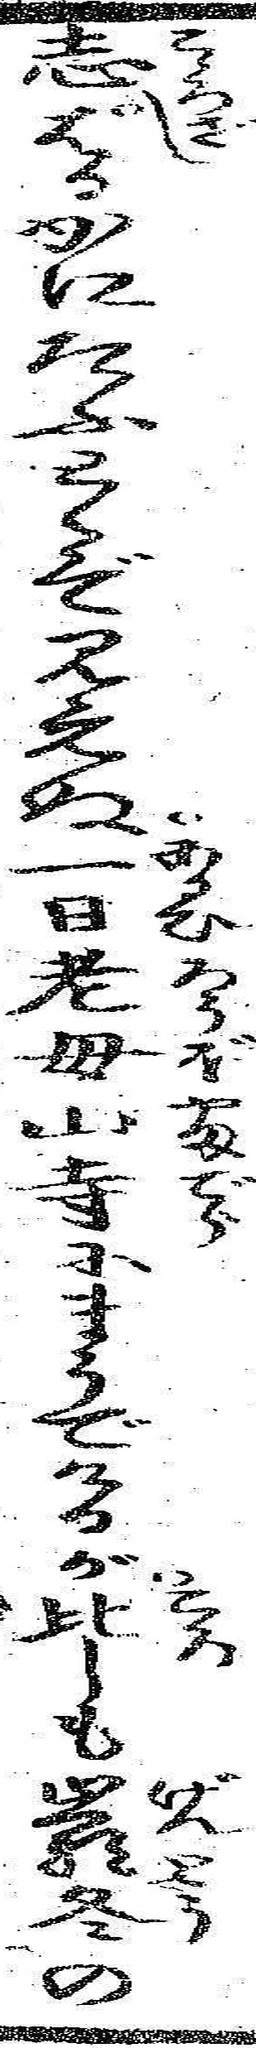志。はるかにたふとくぞ見えぬ。一日老母山寺にまうでけるが。比しも厳冬の
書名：昔話稲妻表紙
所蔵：国文学研究資料館
